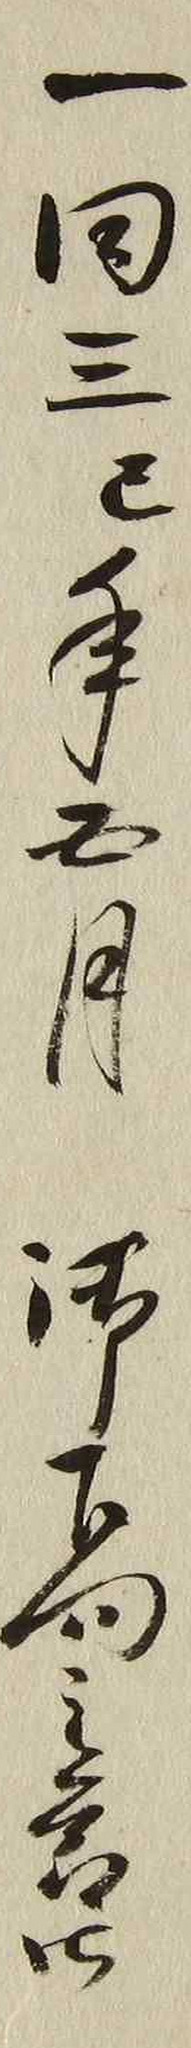一同三巳年五月御下向之節御
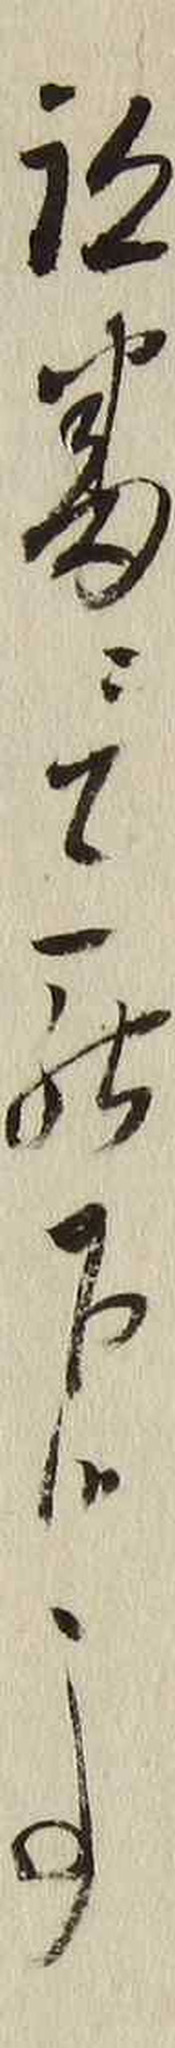跡番ニて罷下候事
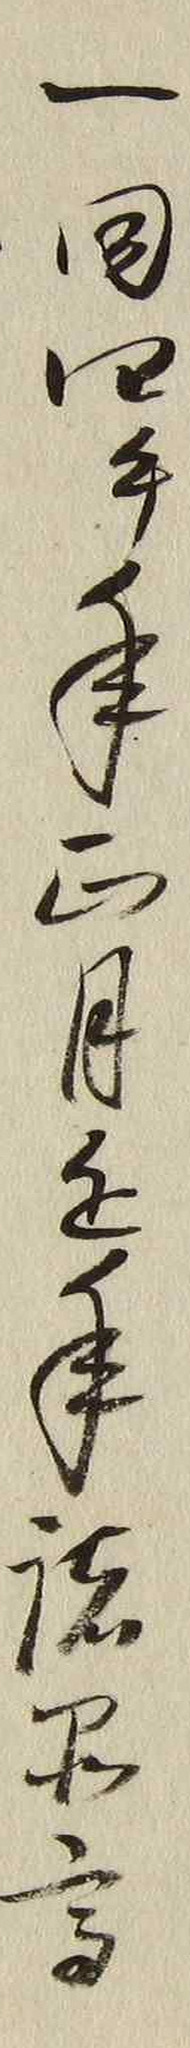一同四午年正月近年諸品高
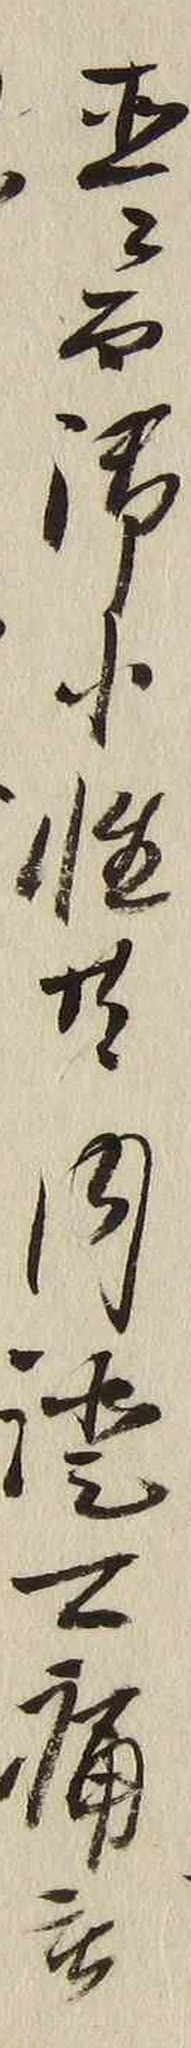直ニ而御小性共内証可痛被
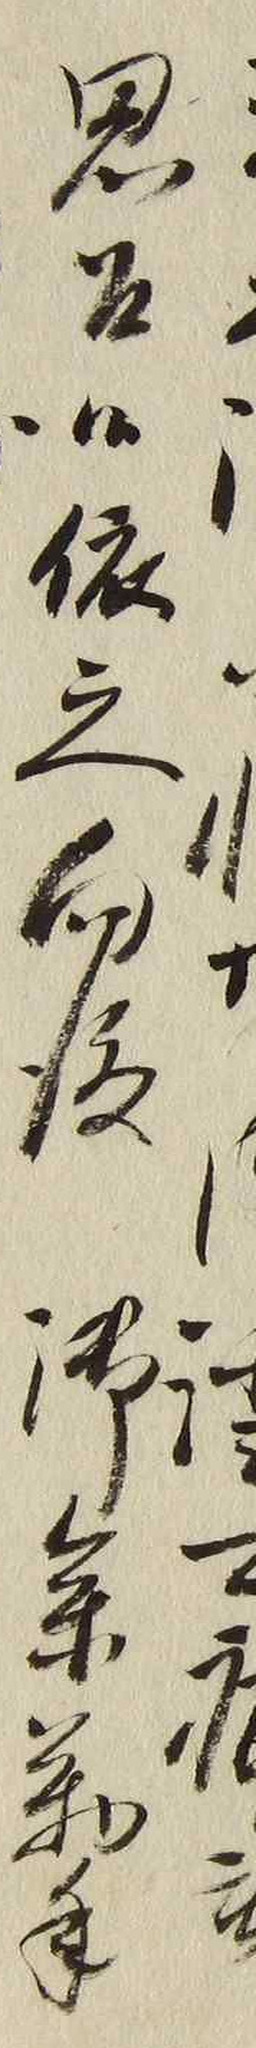思召候依之向後御参勤年
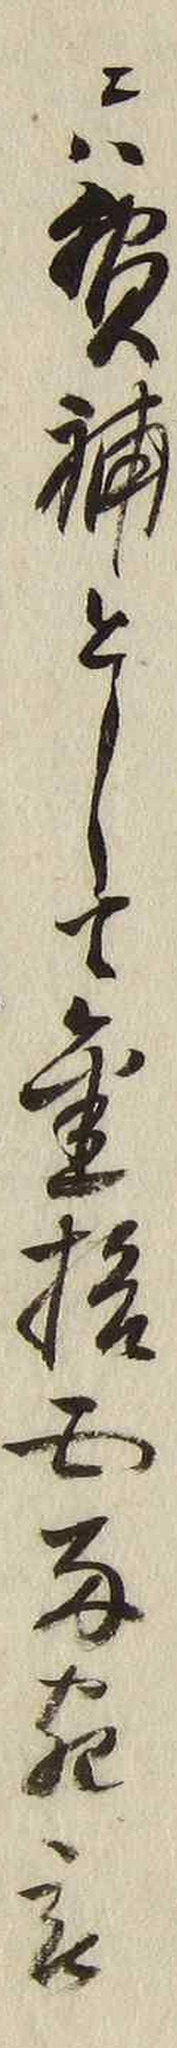ニハ費補として金拾五両宛被
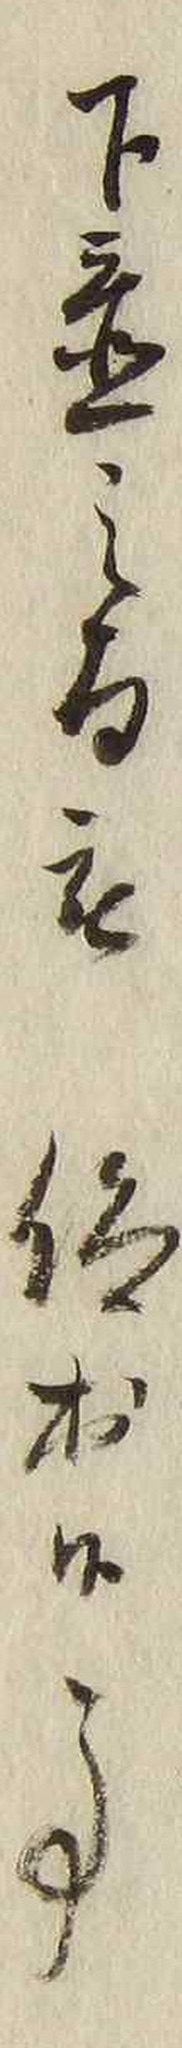下置之旨被仰出候事
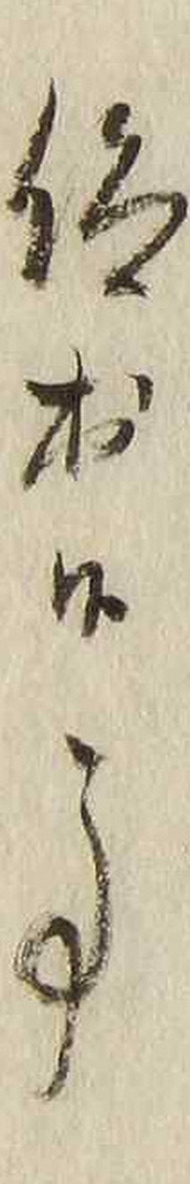仰付候事

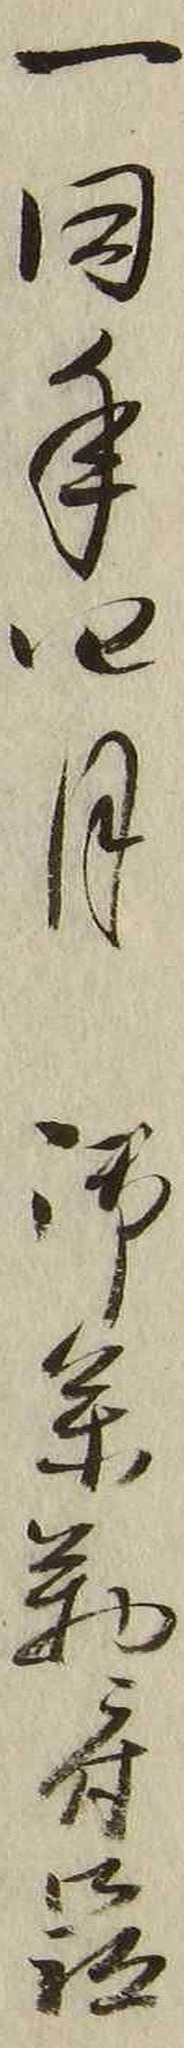一同年四月御参勤ニ付御跡
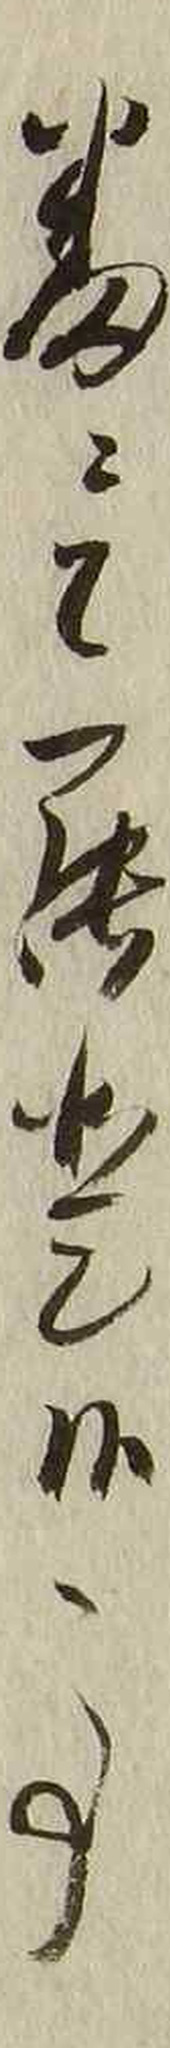番ニて罷登候事
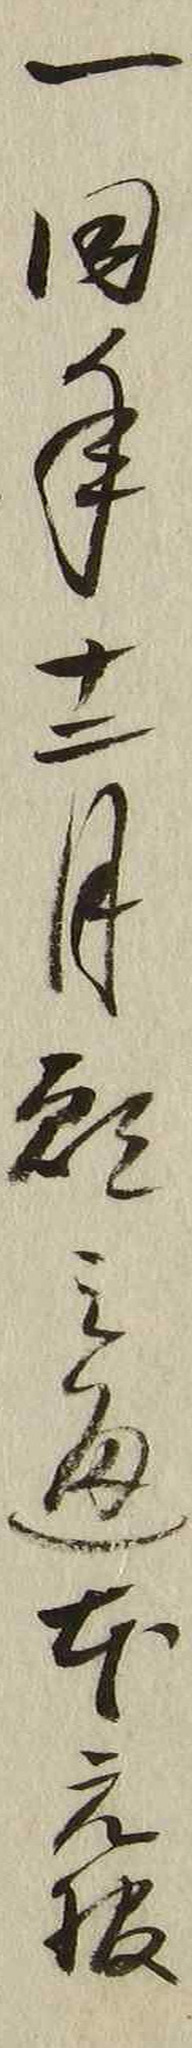一同年十二月願之通本元服
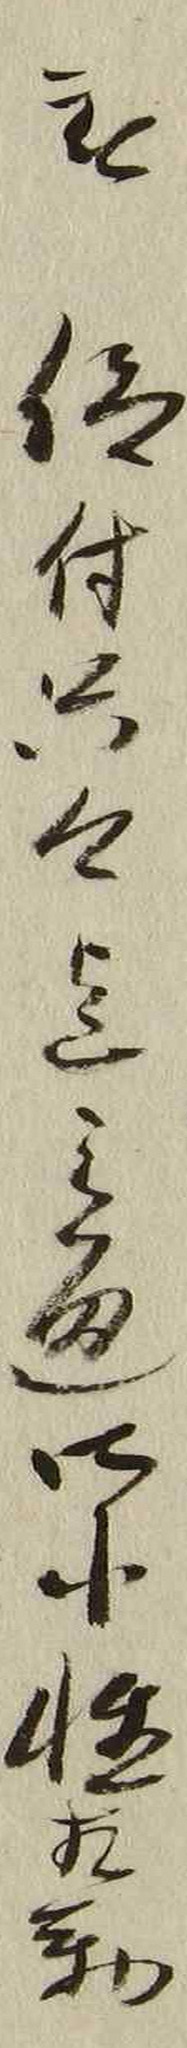被仰付只々迄之通御小性相勤
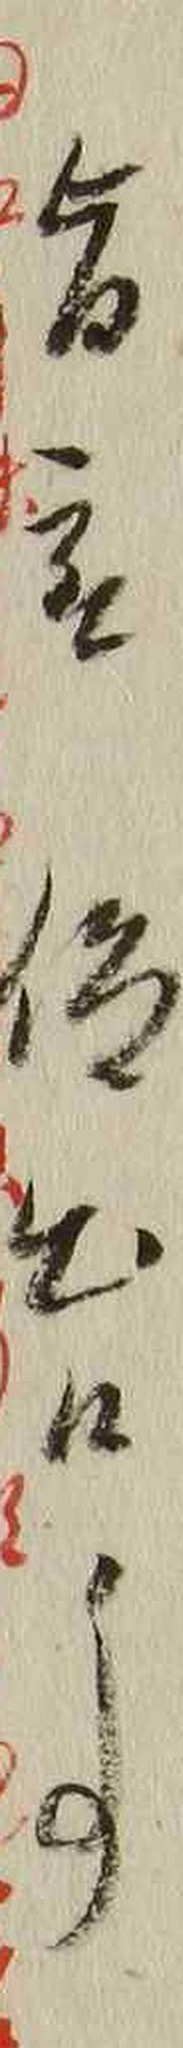旨被仰出候事
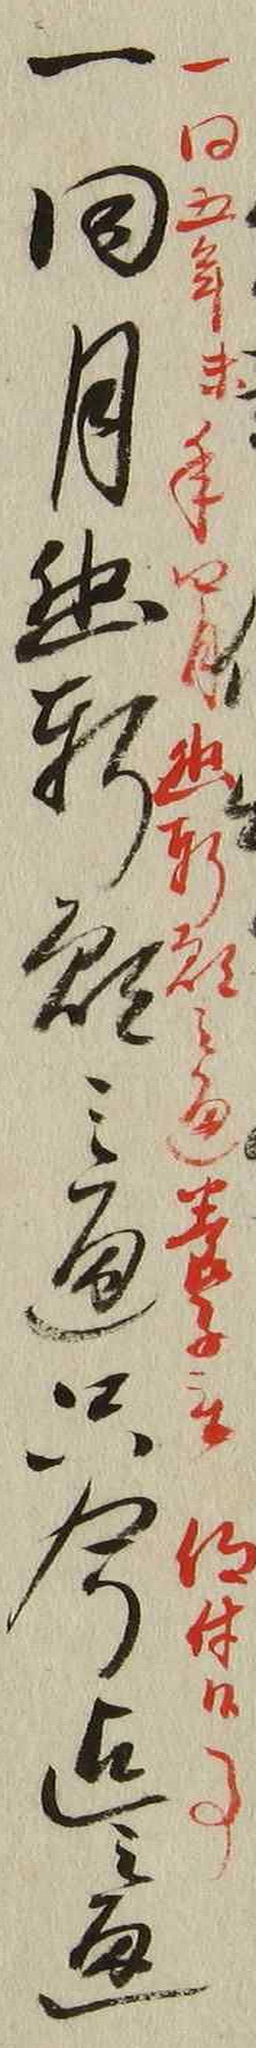一同月幽軒願之通只何迄之通
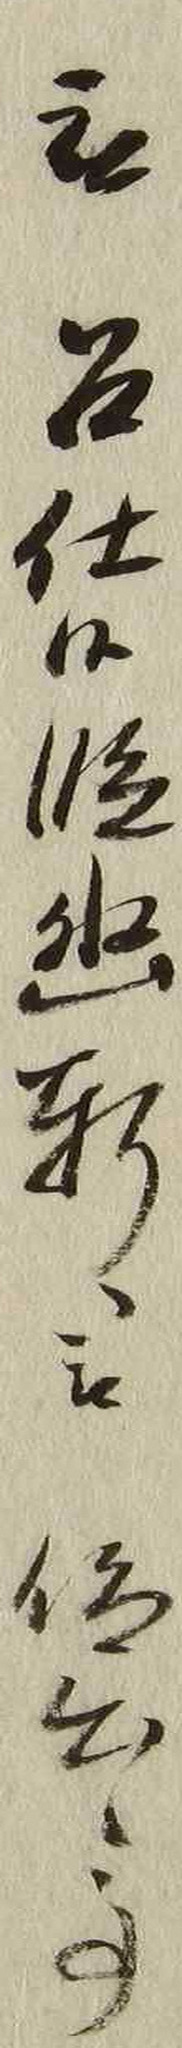被召仕候段幽軒へ被仰出候事
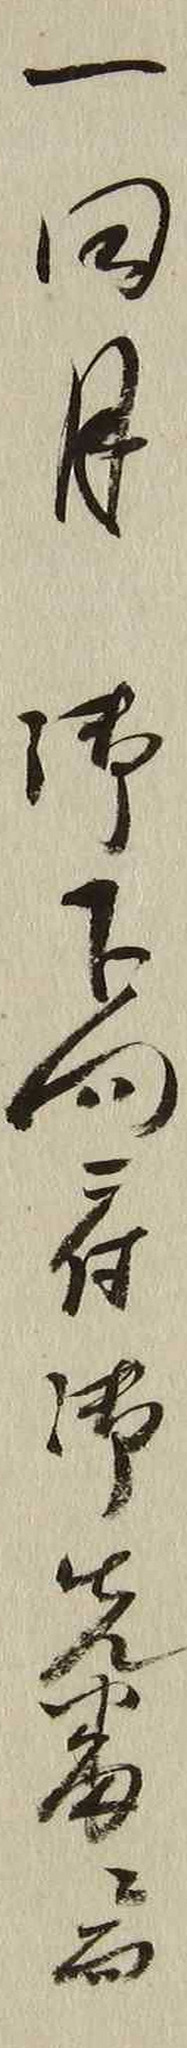一同月御下向ニ付御先番ニ而
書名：諸士系譜　巻之355　す之部5
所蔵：会津若松市立会津図書館
